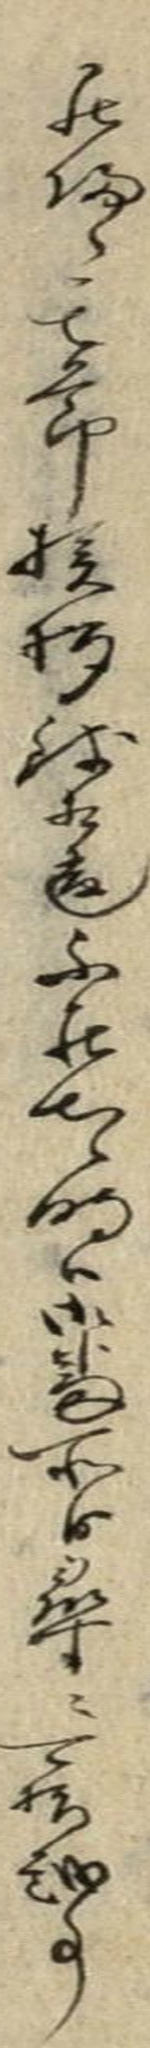罷帰候其節挨拶致相違不罷出候時は御番所ゟ尋に可指越事
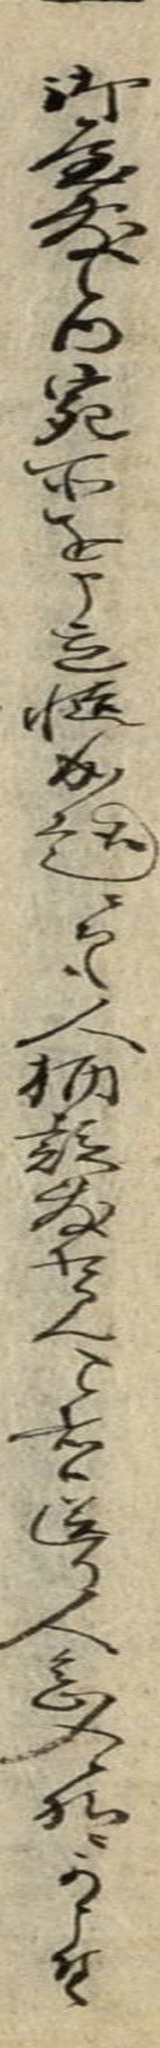一御屋敷之内宛所を申立慥成趣にても人柄疑敷相見へ候者は送り人念入候様に可申付候
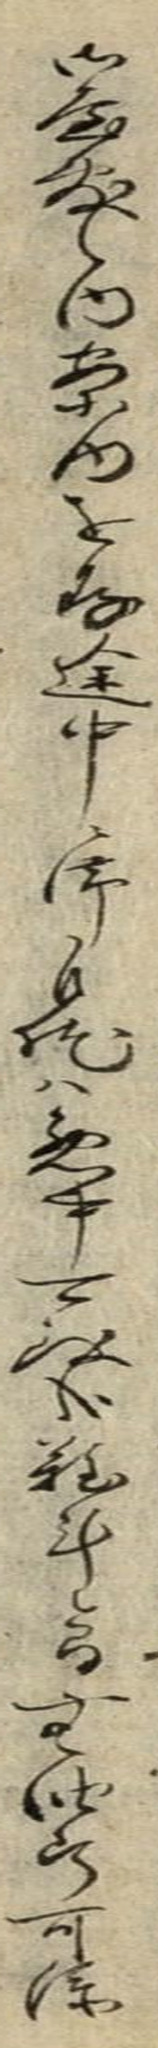御屋敷之内案内を存途中に滞自然は悪事可致哉難計候間無油断可添
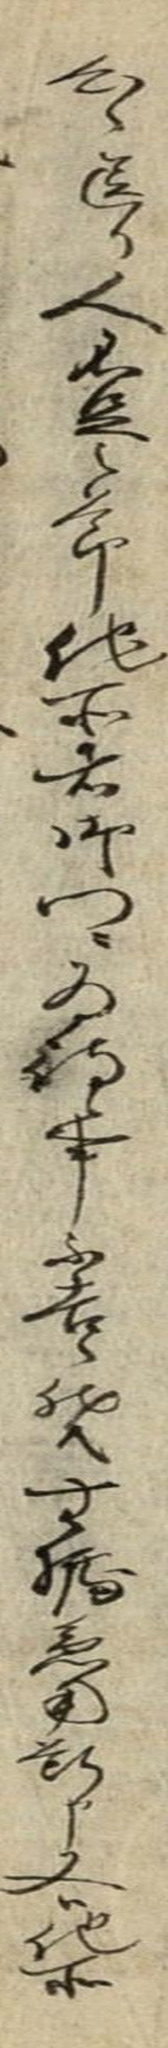心候送り人不足之節他所者御門に為待候事不苦候然共無據急用断申又は他所
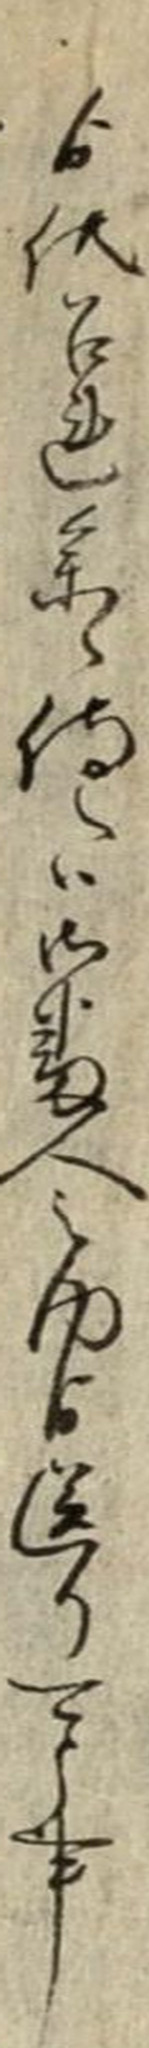ゟ供召連参候侍へは御番人之内ゟ送り可申事
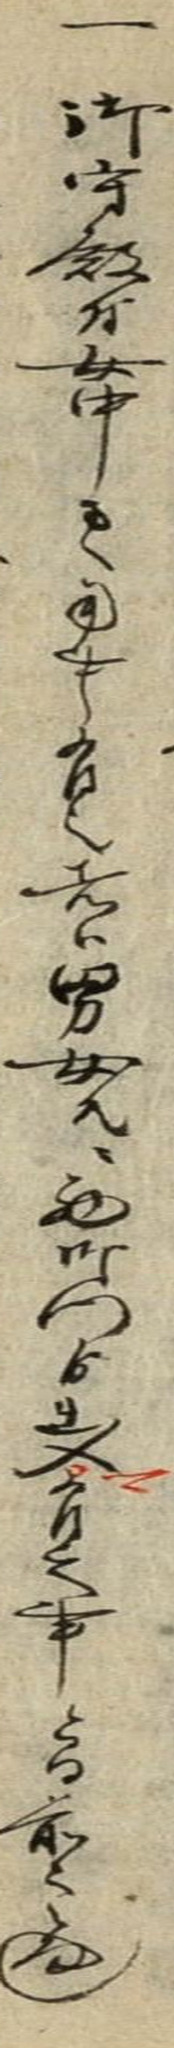一御守殿付女中方へ用事有之者は男女共に西御門ゟ出入有之事候間前々之通
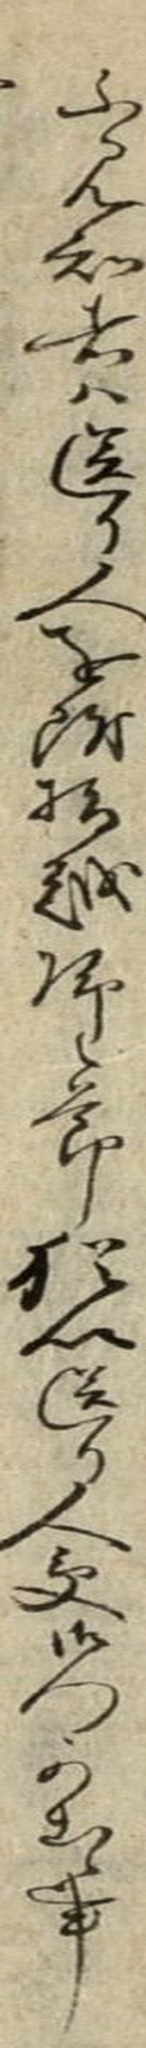不見知者は送り人を附指越帰之節猶以送り人受御門可出候事
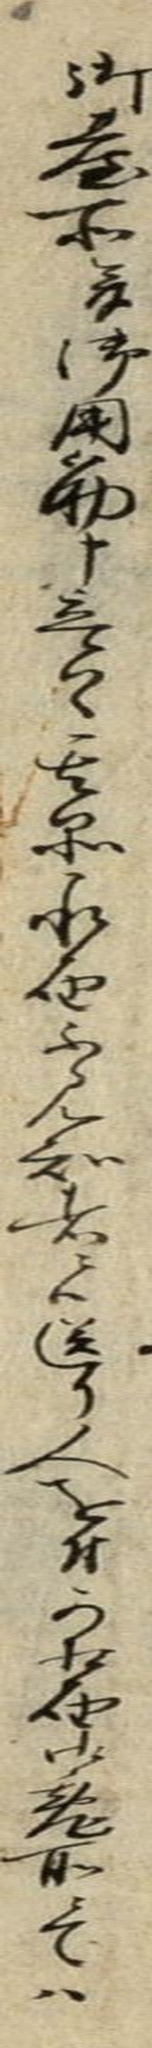一御台所幷御用筋申立候はゝ其品承届不見知者には送り人を付可相届御台所にては
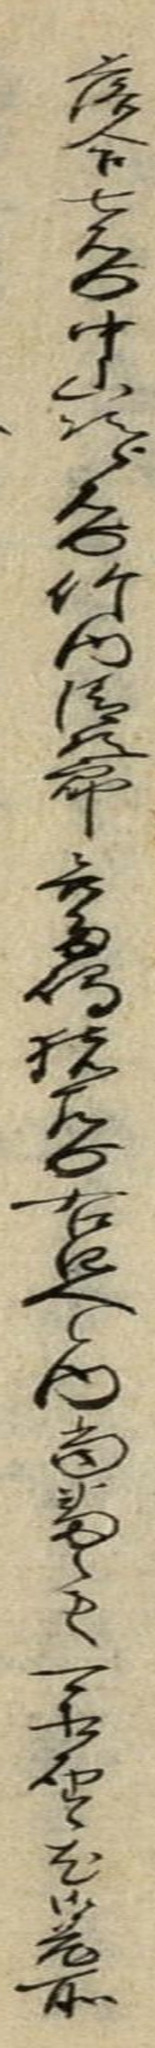落合七右衛門中山次郎右衛門竹内清次郎幷多島猪左衛門右四人之内当番之方へ可相届候尤御台所
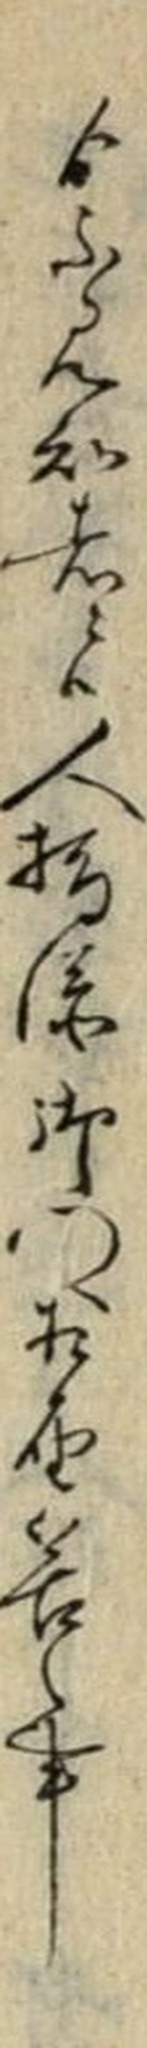ゟ不見知者には人指添御門へ相届筈之事
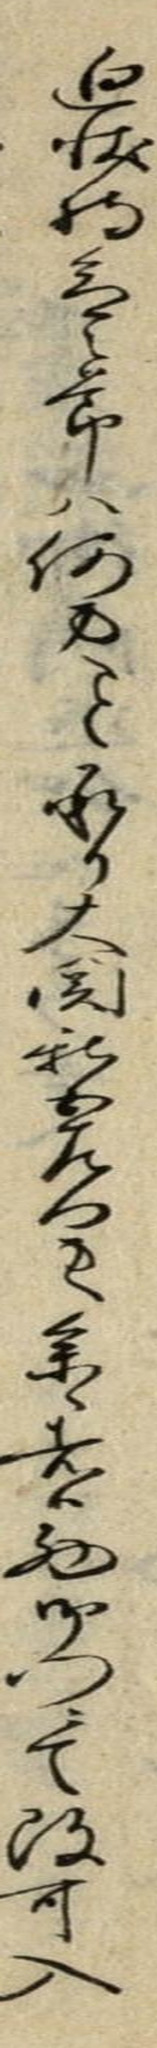一廻状持参之節は何方へと承り大関新五左衛門方へ参候者は西御門にて改可入
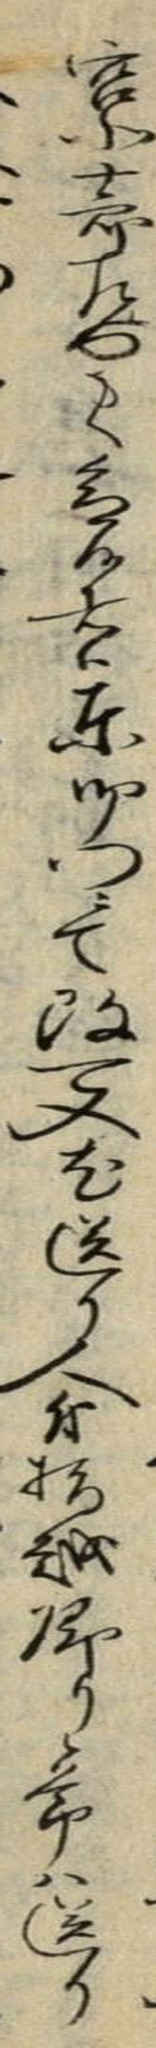宮北十郎左衛門方へ参候者は東御門にて改可入尤送り人付指越帰り候節は送り
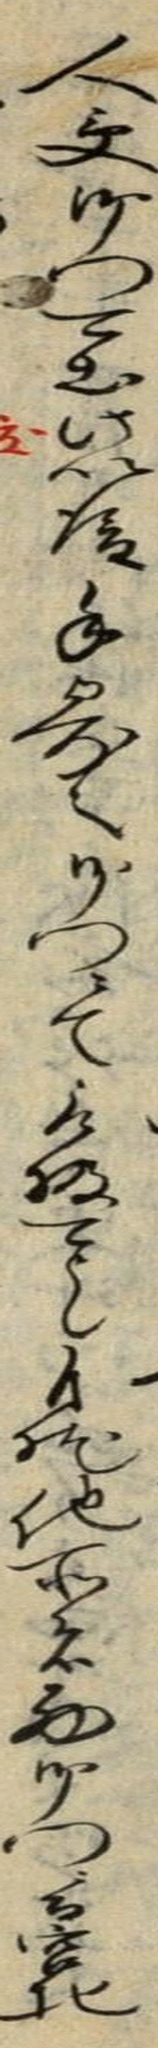人受御門可出此以後手寄之御門にて取扱可申候自然他所者西御門にて宮北
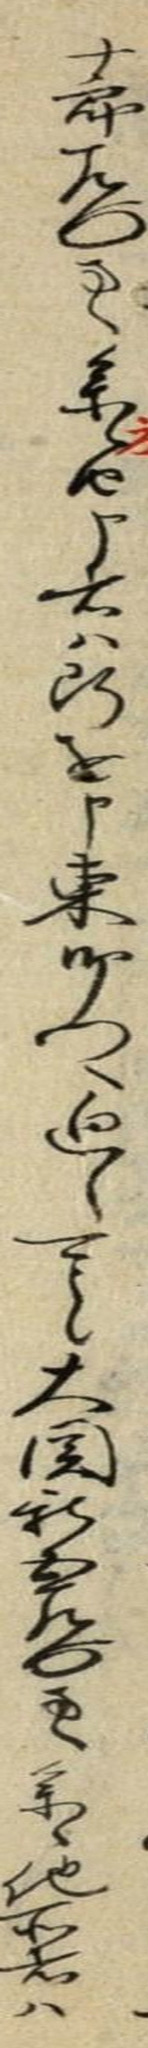十郎左衛門方へ参候由申者は断を申東御門へ廻し可申候大関新五左衛門方へ参候他所者は
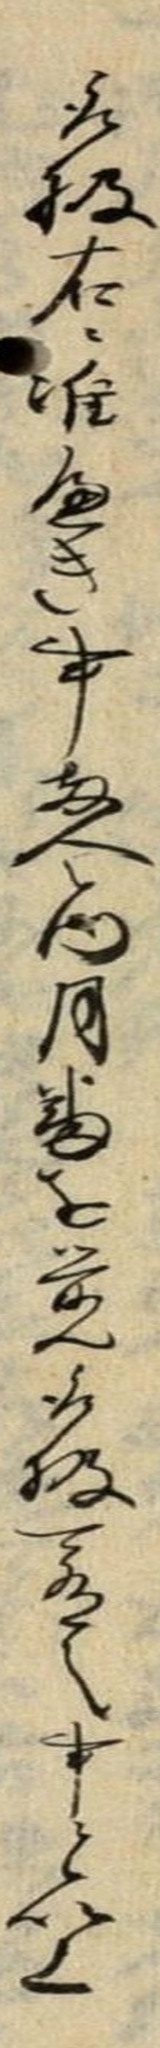取扱右に准へき事両人之内月番を覚取扱可有之事に候以上
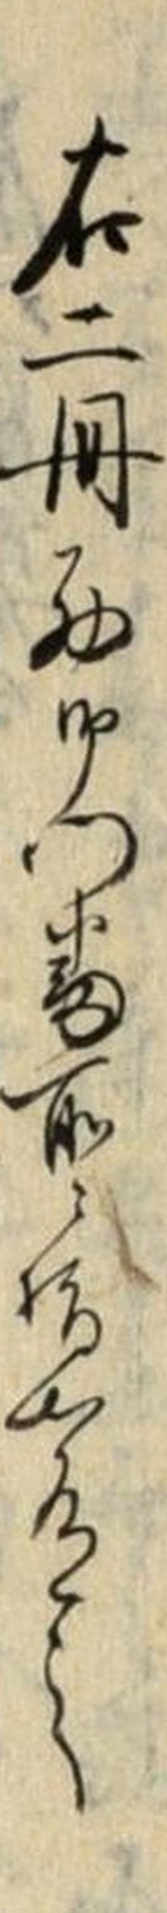右二冊西御門番所に指出有之
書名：三都并道中之部
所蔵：福井県文書館 Fukui Prefectural Archives
